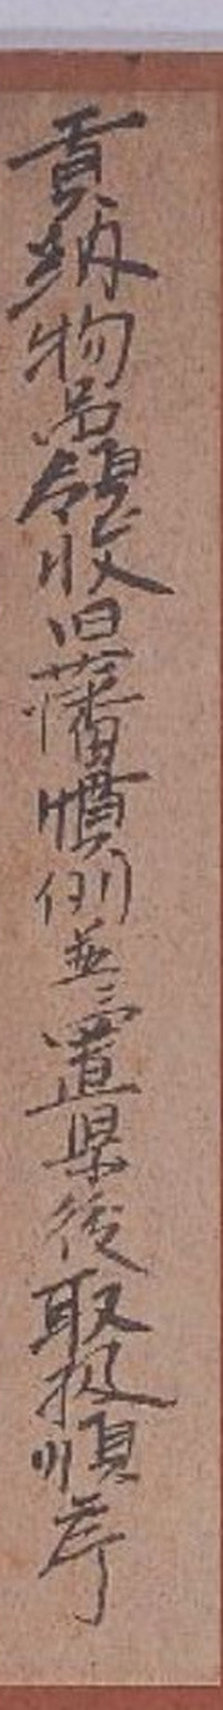貢納物品領収旧藩慣例並ニ置県後取扱順序

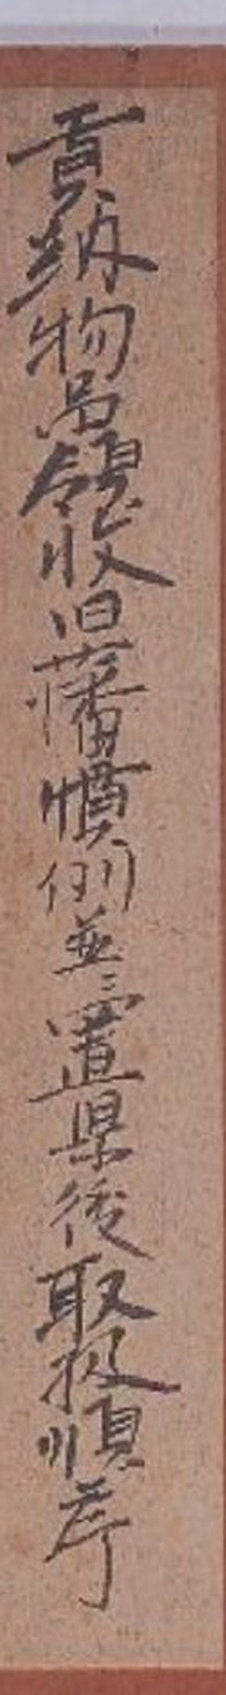貢納物品領収旧藩慣例並ニ置県後取扱順序

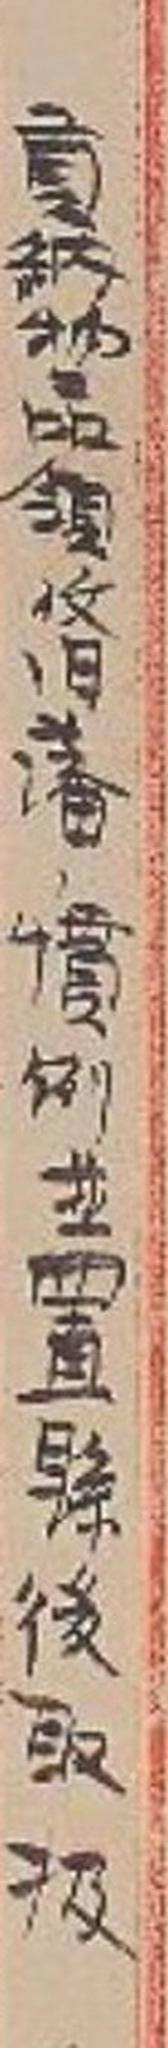貢納物品領収旧藩慣例並置県後取扱
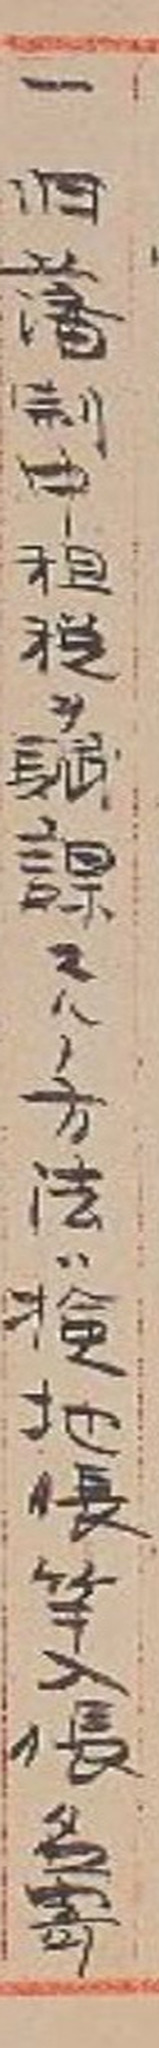一旧藩制中租税ヲ賦課スルノ方法ハ検地帳竿入帳名寄
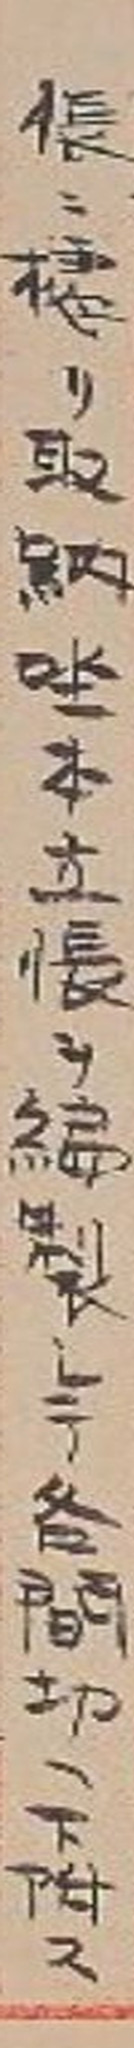帳ニ拠リ取納坐本立帳ヲ編製シテ各間切ヘ下附ス
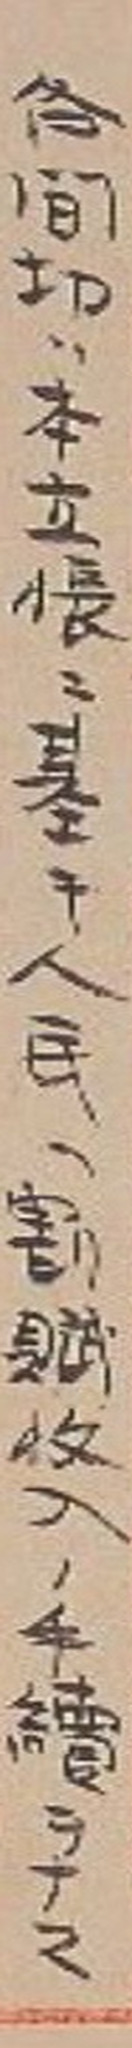各間切ハ本立帳ニ基キ人民ヘ割賦収入ノ手続ヲナス
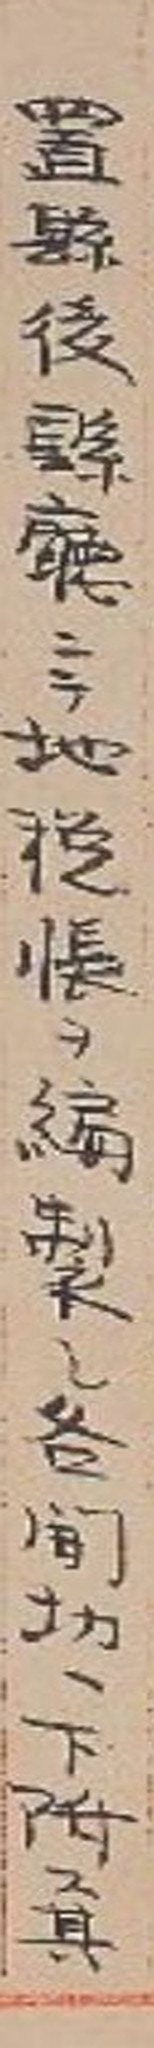置県後県庁ニテ地税帳ヲ編製シ各間切ヘ下附ス其
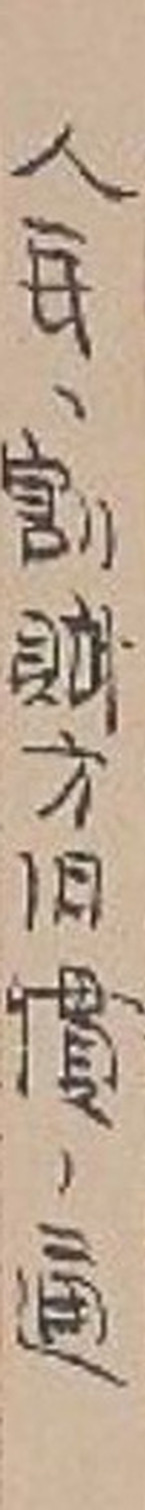人民ヘ割賦方旧慣ノ通
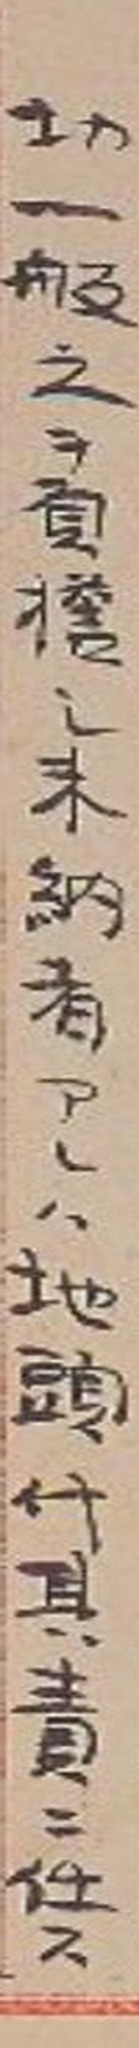切一般之ヲ負担シ未納者アレハ地頭代其責ニ仕ス
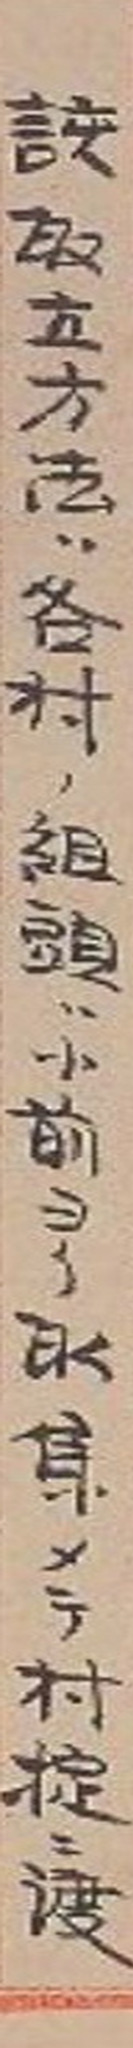該取立方法ハ各村ノ組頭ハ小前ヨリ取集メテ村掟ニ渡
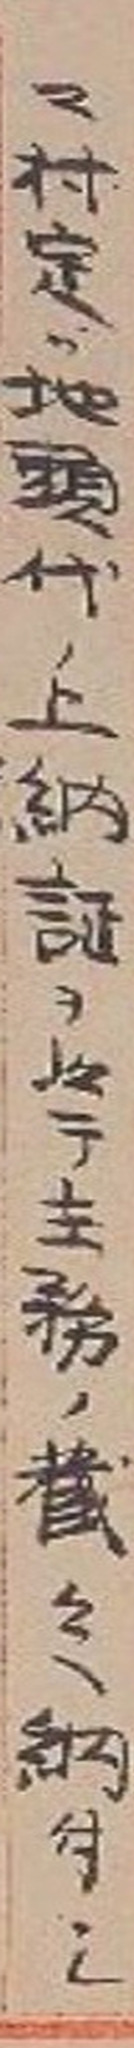ス村定ハ地頭代ノ上納証ヲ以テ主務ノ蔵々ヘ納付シ
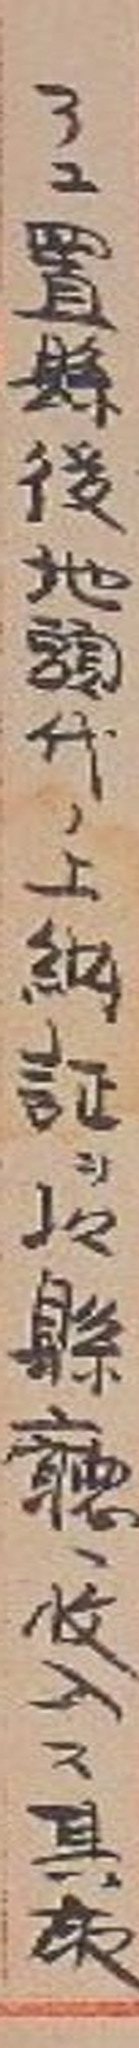了ユ置県後地頭代ノ上納証ヲ以県庁ヘ収入ス其取

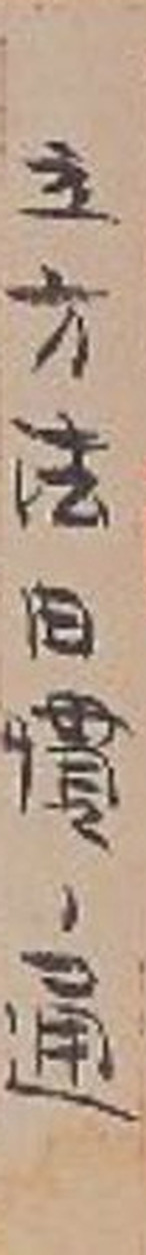立方法旧慣ノ通
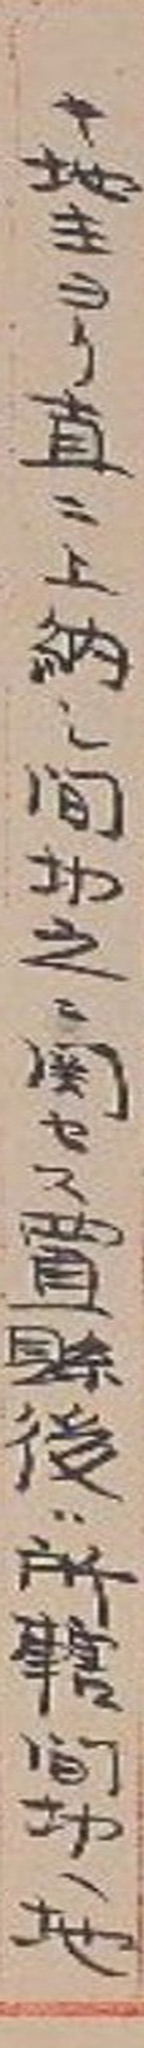キ地主ヨリ直ニ上納シ間切之ニ関セス置県後ハ所轄間切ヘ地
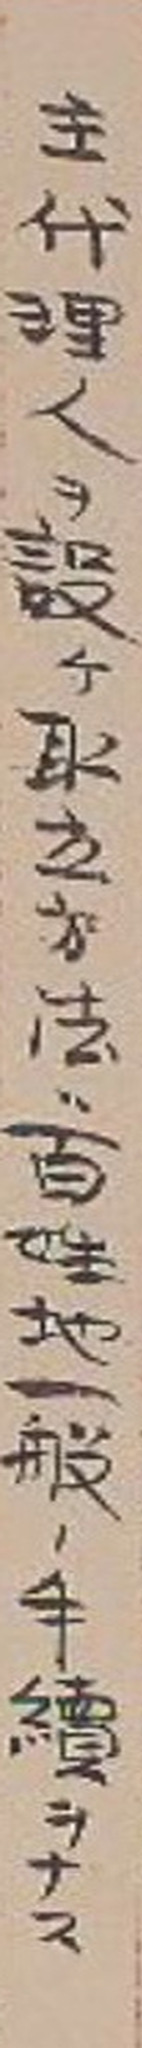主代理人ヲ設ケ取立方法ハ百姓地一般ノ手続ヲナス
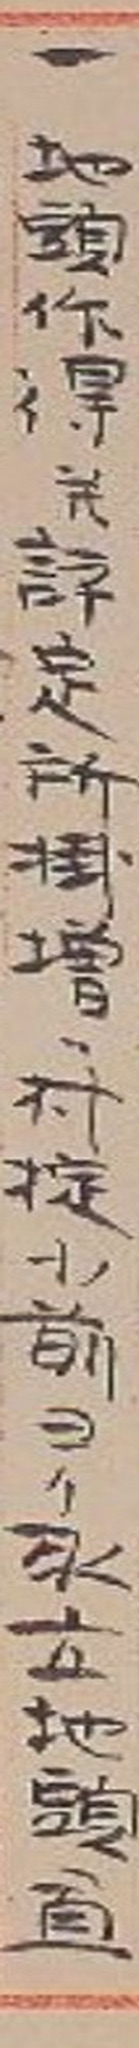一地頭作得并評定所掛増ハ村掟小前ヨリ取立地頭直
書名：貢納物品領収旧藩慣例並ニ置県後取扱順序
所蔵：University of the Ryukyus Library
